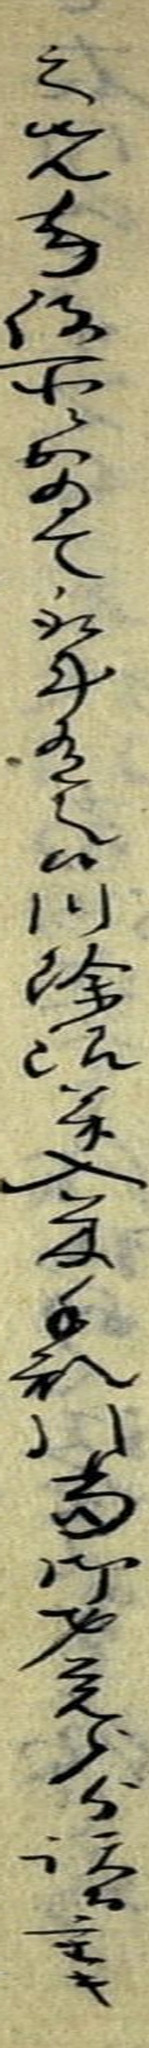之先年役所におゐて取斗有之候川除銀并入米手形引当御才覚被成候訳而重キ
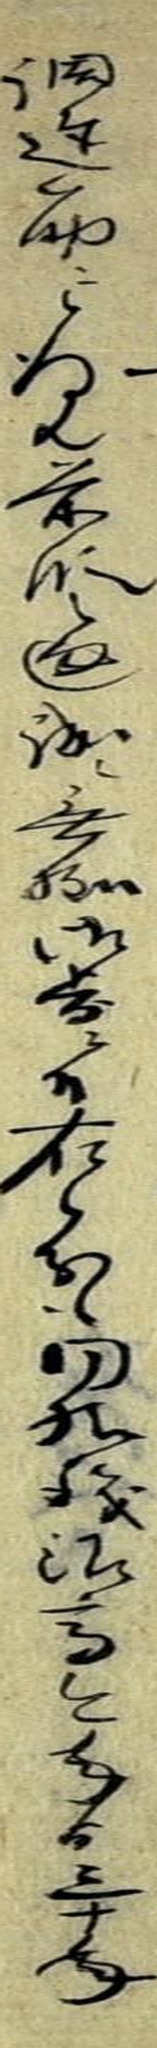調達筋に候得共前段之通誠に無拠御歩に付右之分も同様残銀高今年ゟ三十年
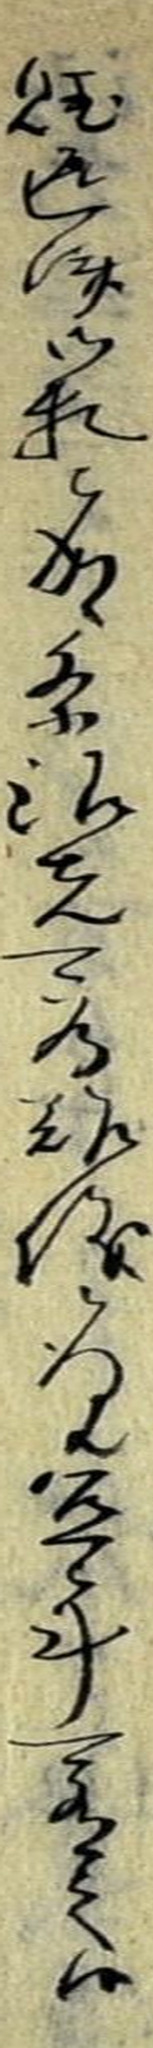賦返済御頼被成候条銀元可為難儀候得共宜被斗可有之候
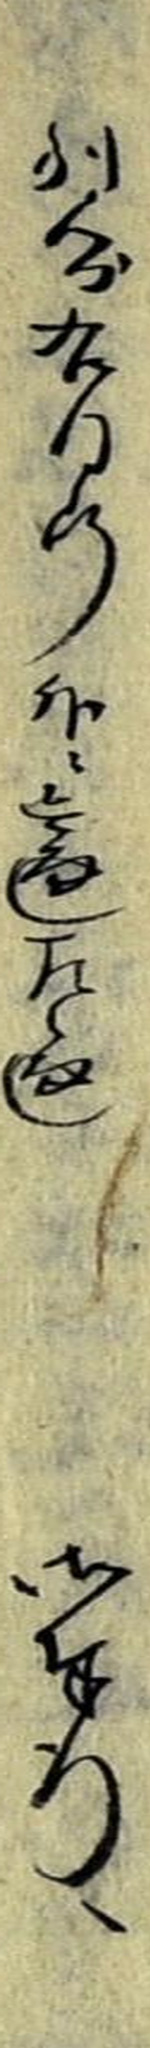別紙右同断外壱通左之通御奉行へ
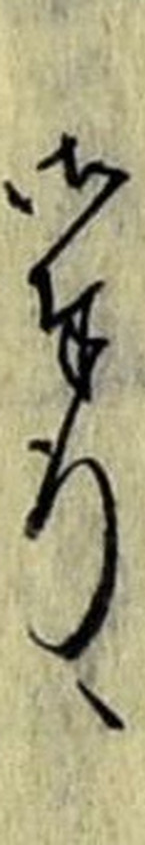御奉行へ
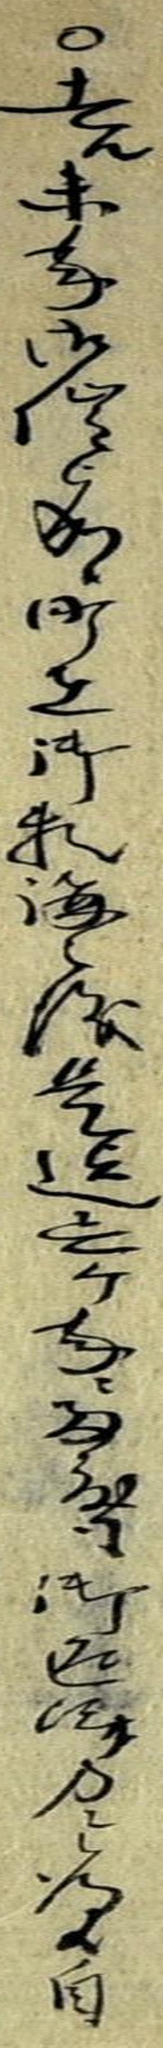○去未年御催被成候町在御頼講之儀是迄壱ヶ年に両度つヽ御返済方に候得共自
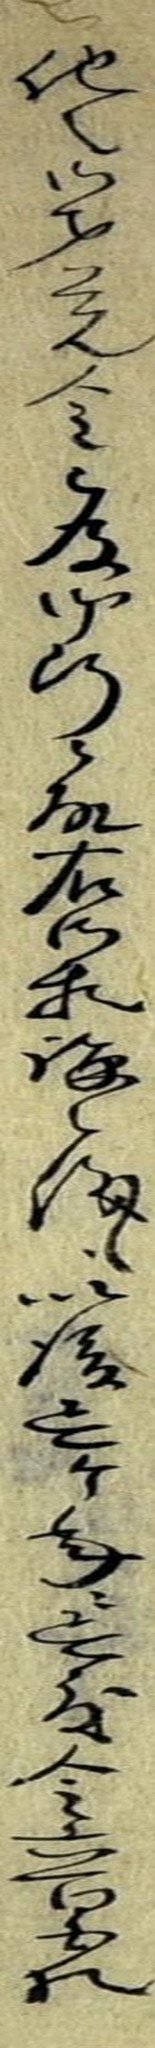他之御才覚金被及御断候故右御頼講之儀も以後壱ヶ年に壱度金六百五拾
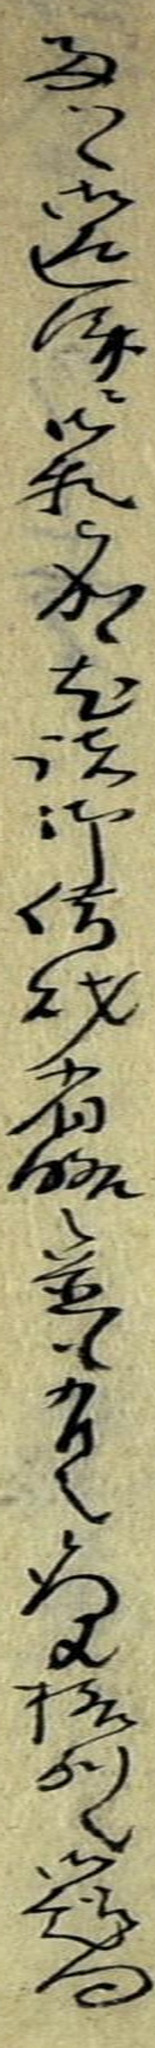両つヽ御返済に御頼被成候尤諸御借財省略之並も有之候得共格別之御趣向
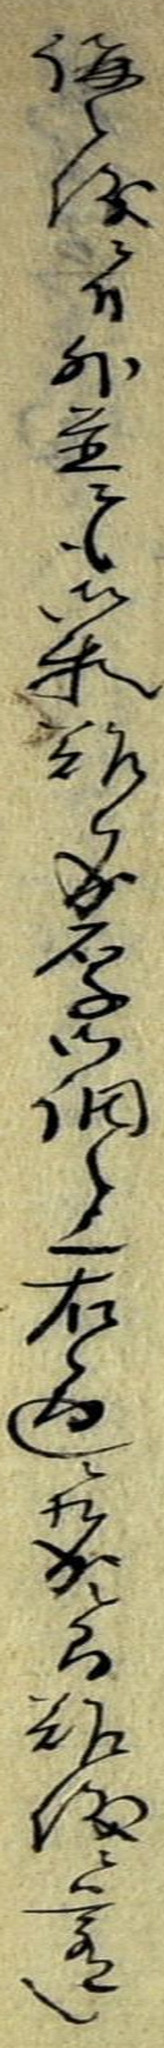講之儀に付外並にも御頼難被成厚御調之上右之通被相成候間難儀には可有之

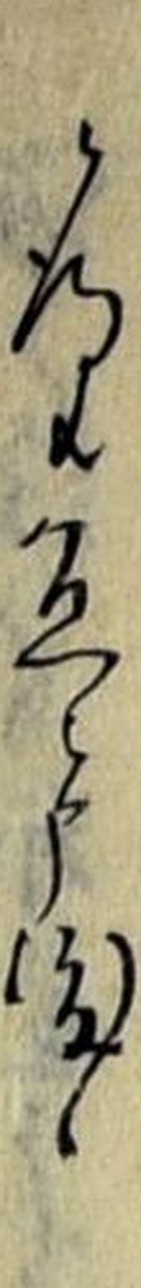候得共宜被申渡候
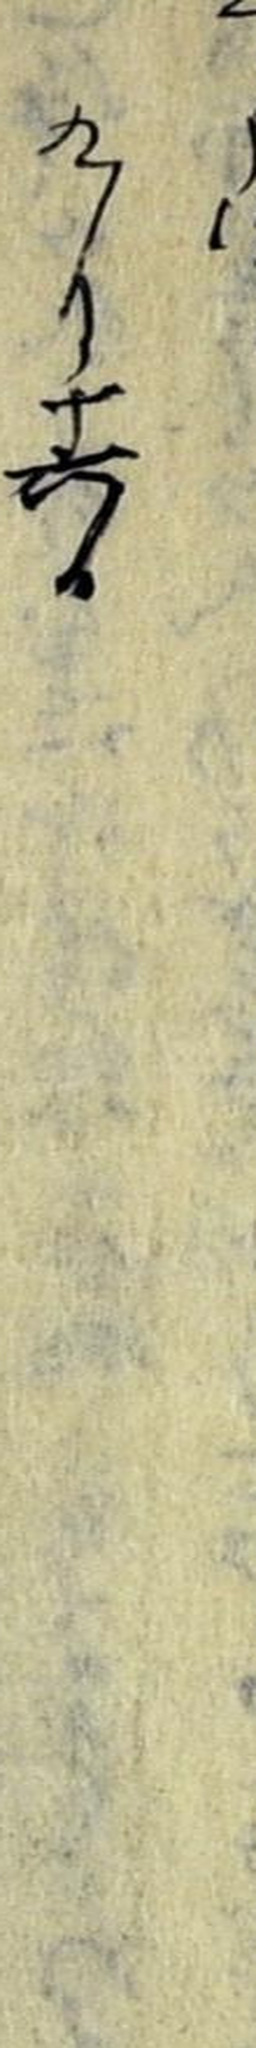九月十六日
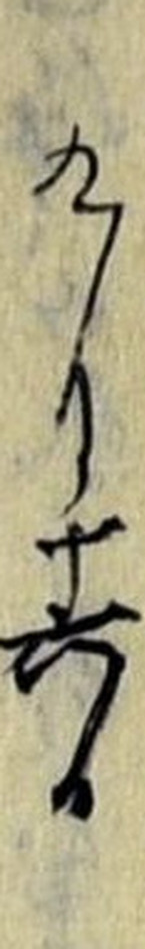九月十六日
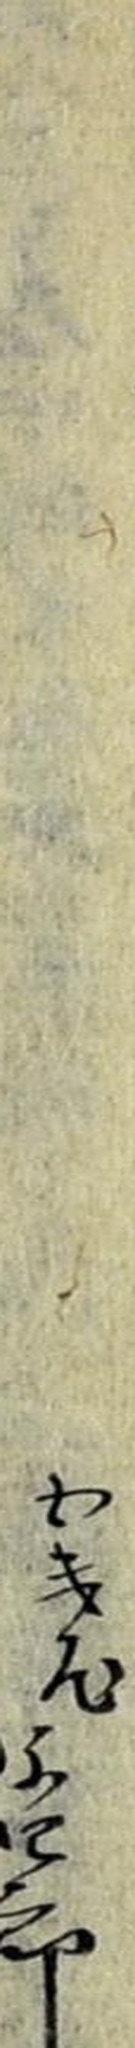五幾屋弥四郎
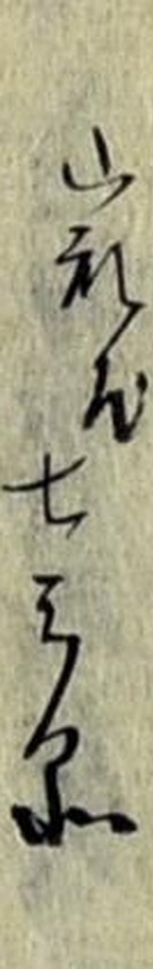山形屋七兵衛
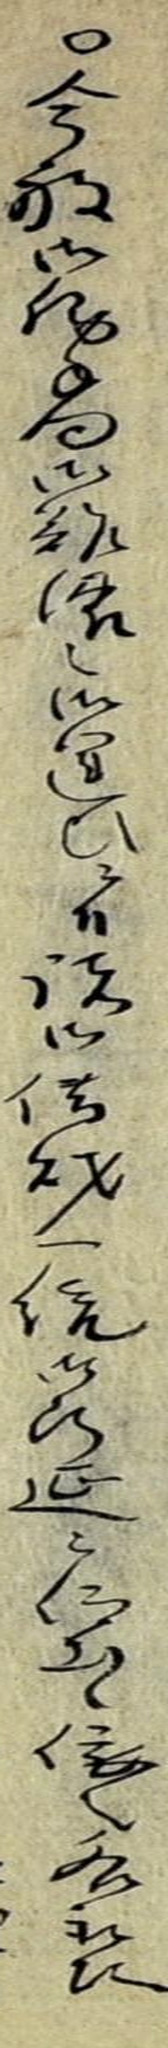○今般御勝手向御澁之御運ひ付諸御借財一統御断延被仰出候依之各取候
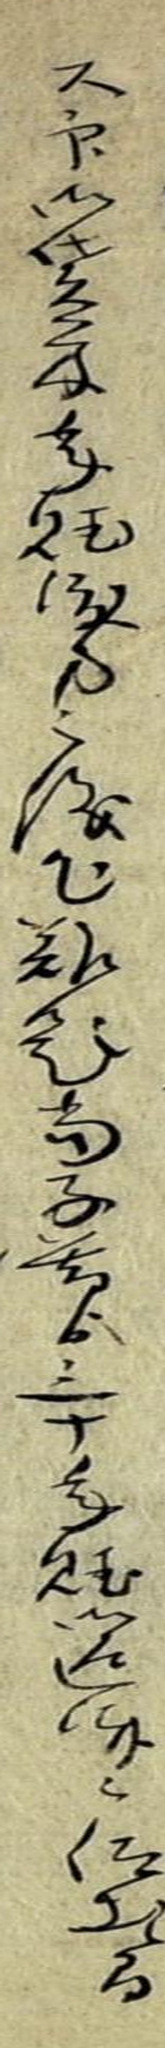ス印御貸米年賦渡方之儀乍難題当子暮ゟ三十年賦御返済被仰出候間
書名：命令之部 四
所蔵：福井県文書館 Fukui Prefectural Archives
